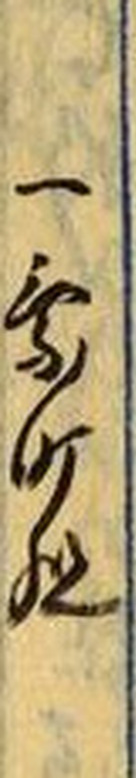一乗町組
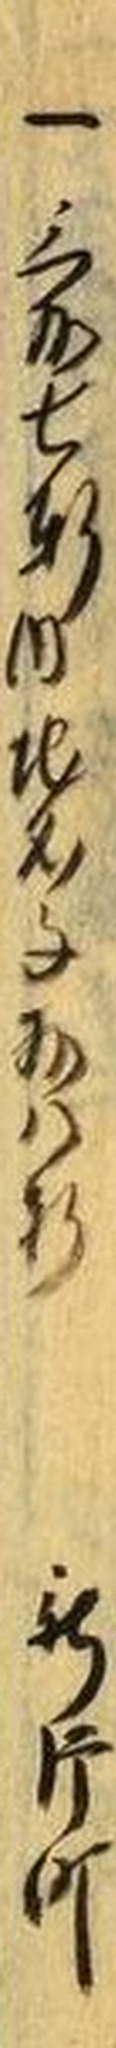一三拾七軒内地名子拾八軒新片町
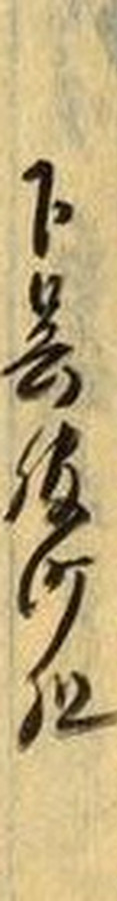下呉服町組
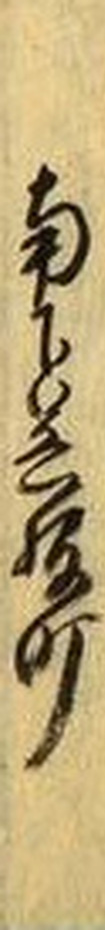下呉服町組

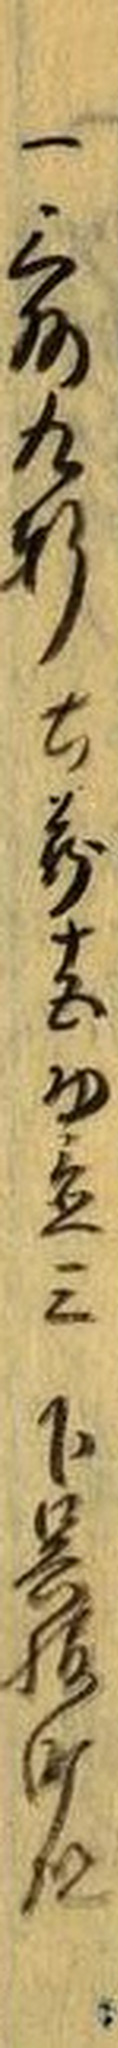一三拾九軒土蔵十五物置三下呉服町組
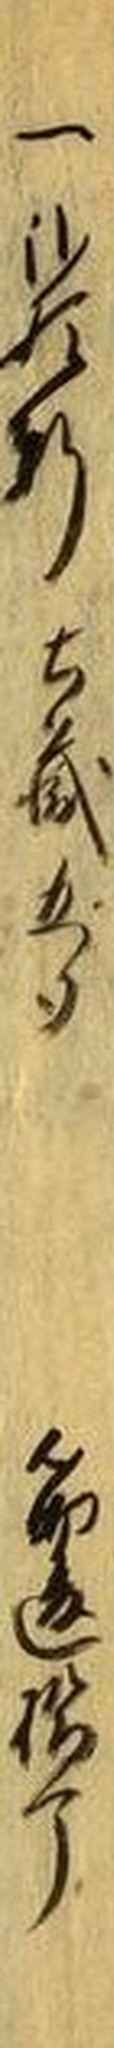一弐拾軒土蔵五ッ筋違橋丁
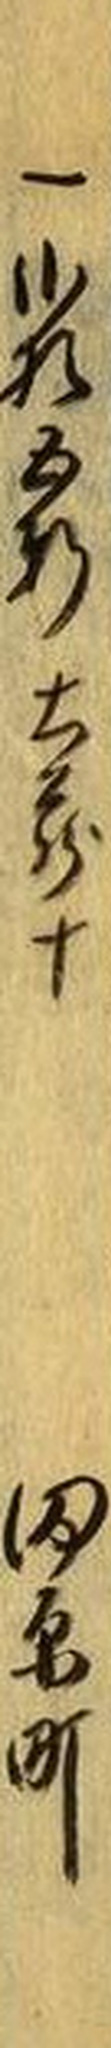一弐拾五軒土蔵十田原町
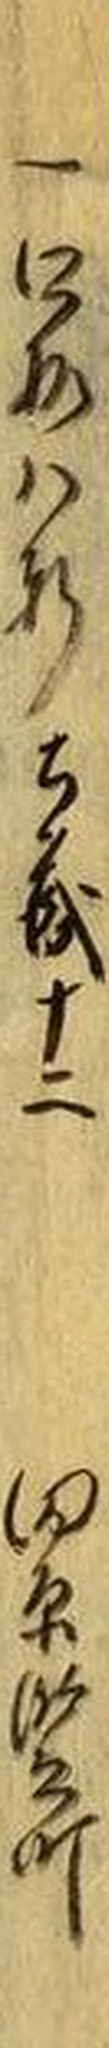一四拾八軒土蔵十二田原竪町
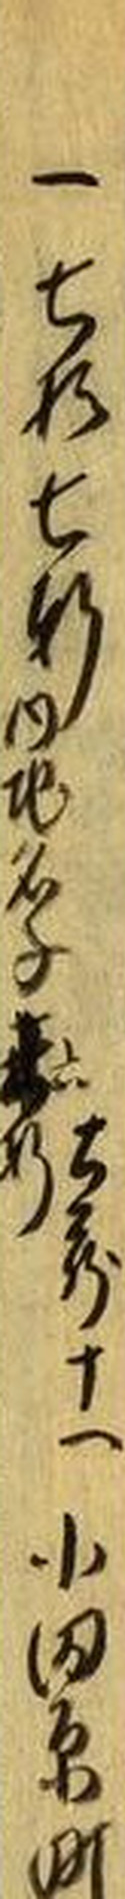一七拾七軒内地名子六軒土蔵十一小田原町
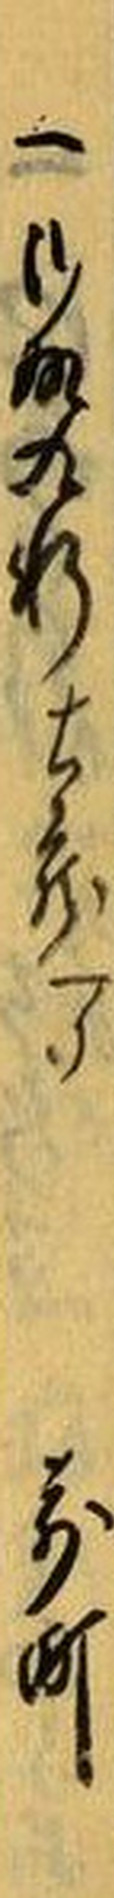一弐拾九軒土蔵一ッ万町
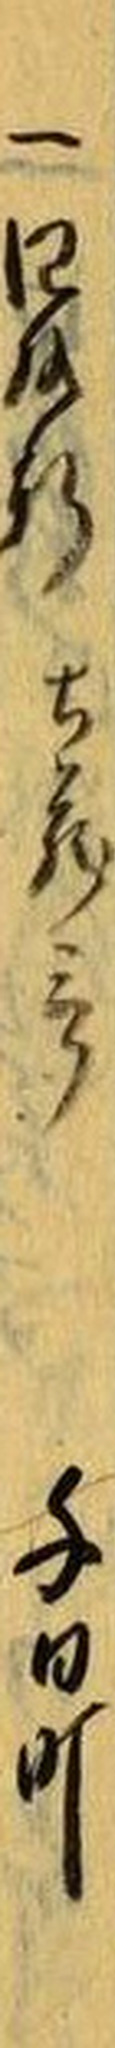一四拾軒土蔵三ッ千日町
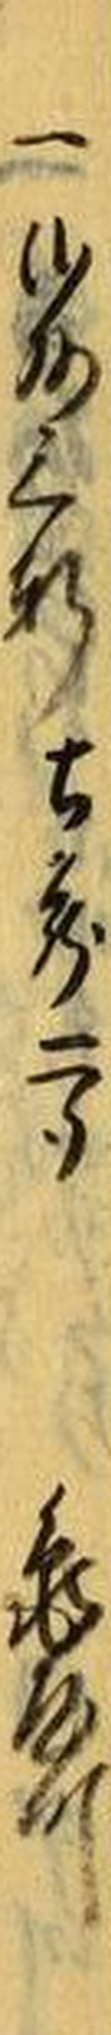一弐拾三軒土蔵一ッ亀屋町
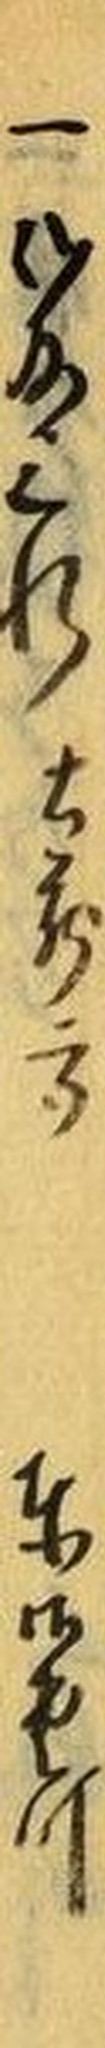一弐拾三軒土蔵二ッ東御堂町
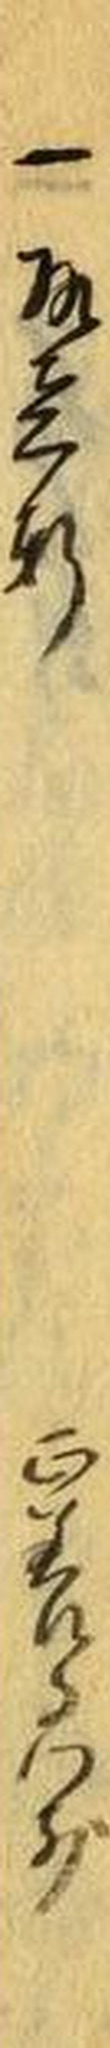一拾三軒正善寺門前
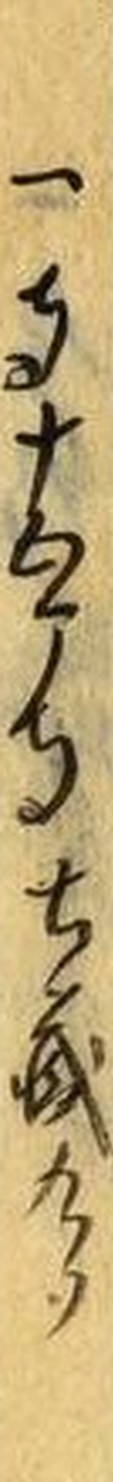一寺十五ヶ寺土蔵九ッ
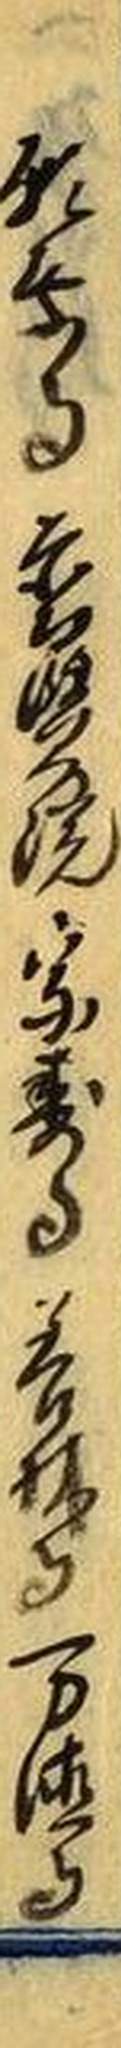願乗寺普賢院宗寿寺善林寺万徳寺
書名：温古集 五巻
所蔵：福井県文書館 Fukui Prefectural Archives
